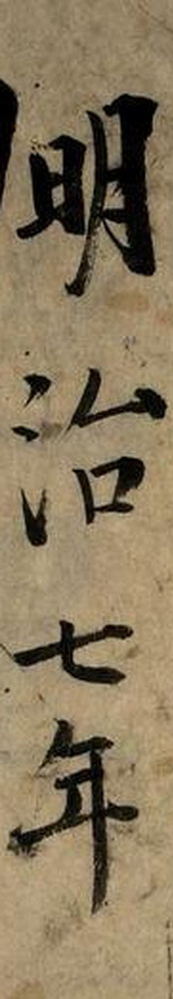明治七年
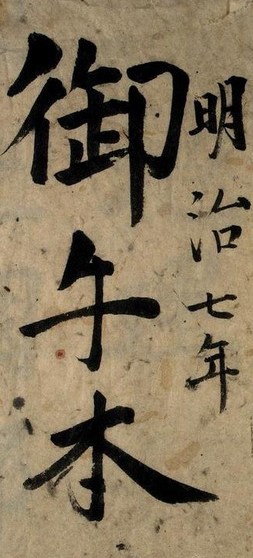御手本
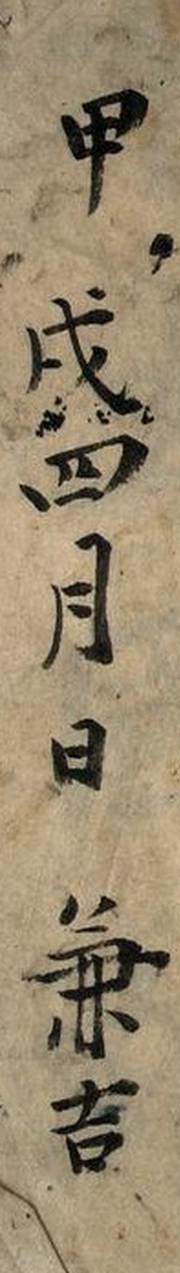甲戌四月日兼吉

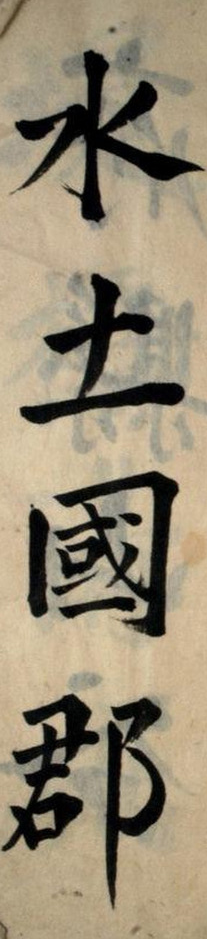水土國郡

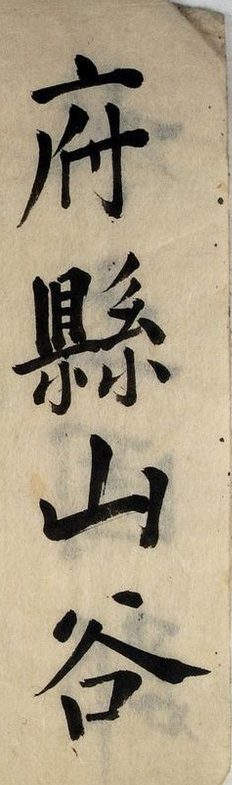府縣山谷
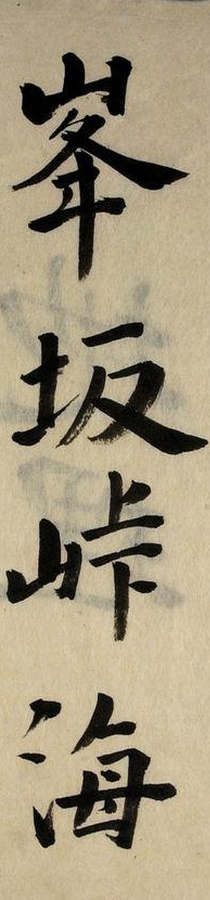峯坂峠海
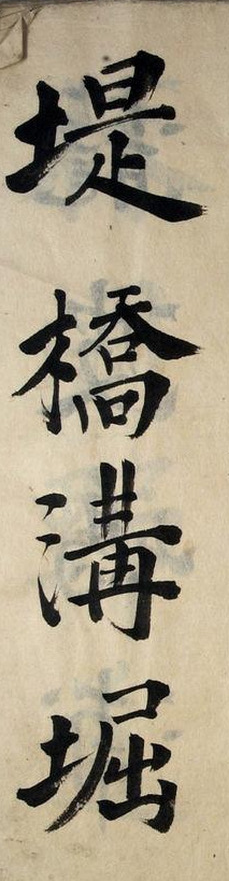堤橋溝堀

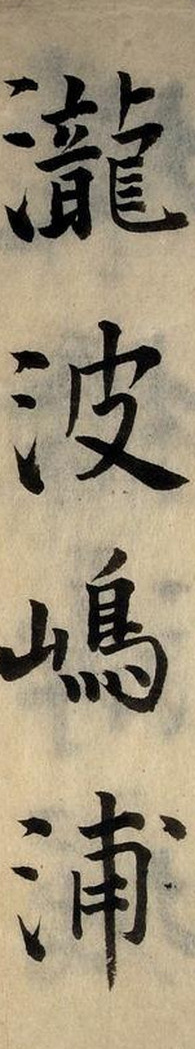瀧波嶋浦
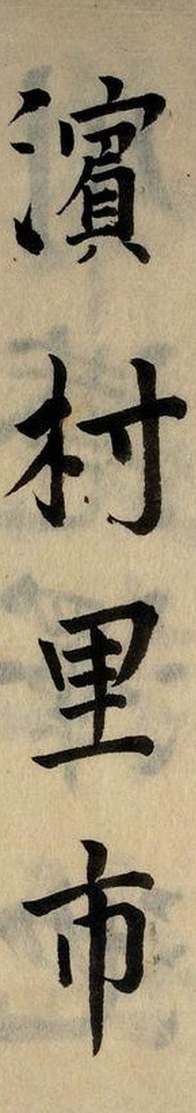濵村里市
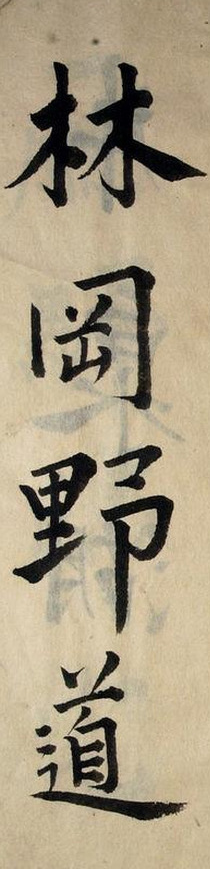林岡野道

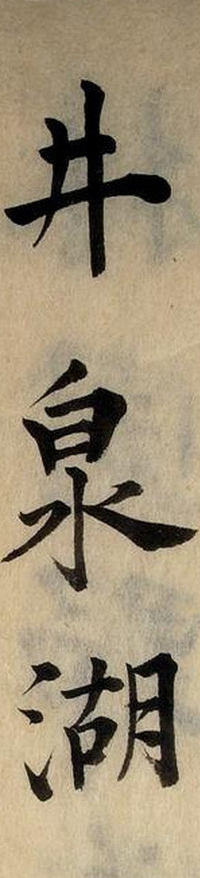井泉湖
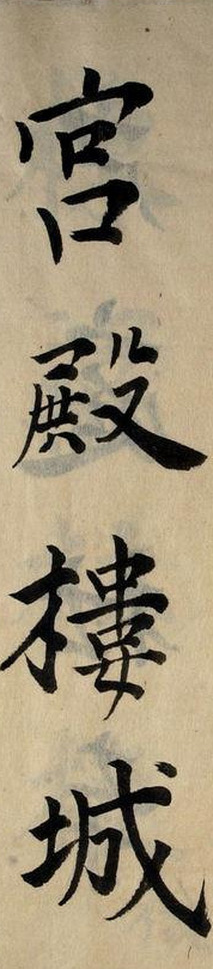宮殿樓城

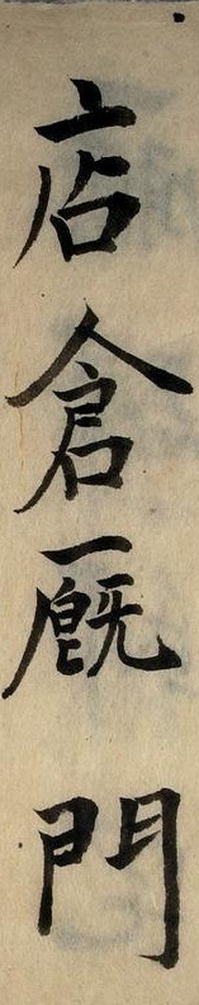店倉厩門
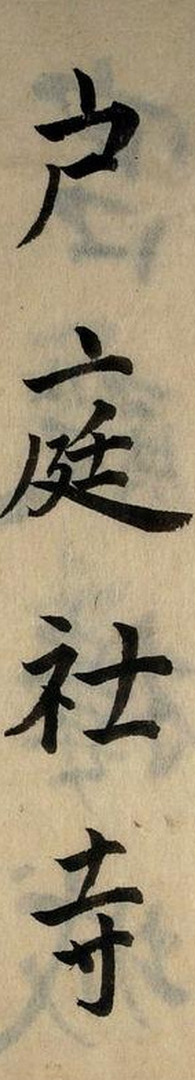戸庭社寺
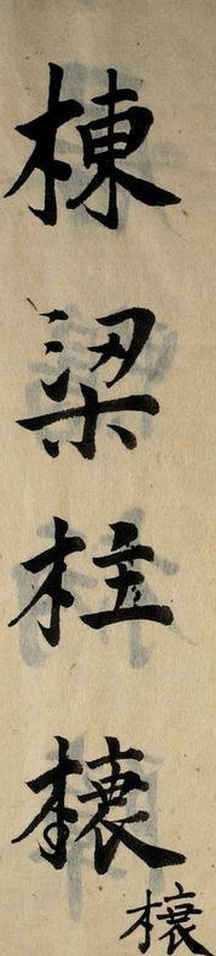棟梁柱榱
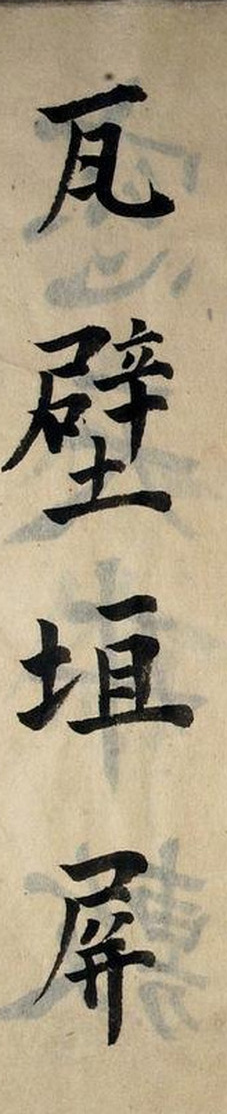瓦壁垣屏
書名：御手本（手習）
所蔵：福井県文書館 Fukui Prefectural Archives
